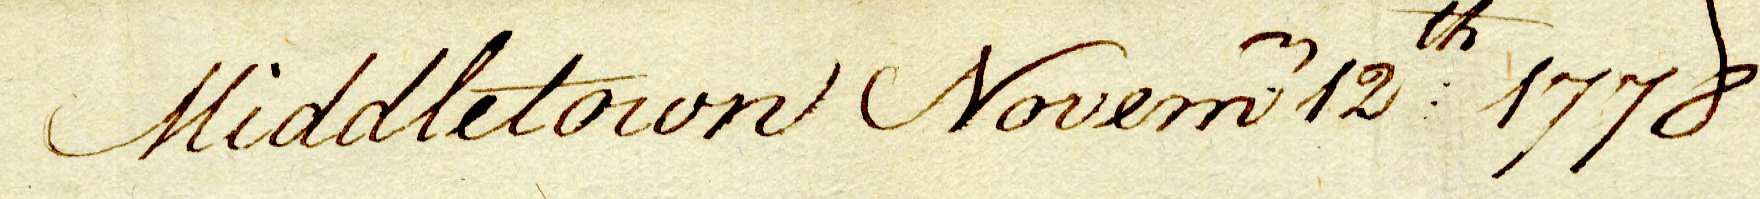Middletown Novem^r. 12^th: 1778
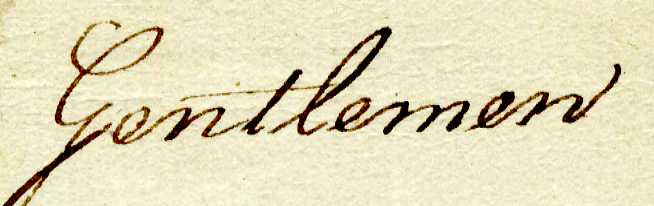Gentlemen
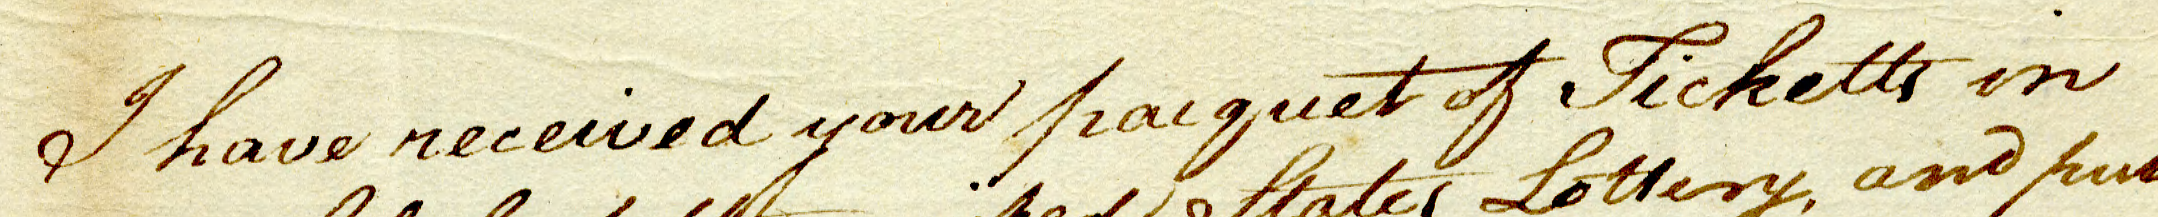I have received your request of Ticketts in
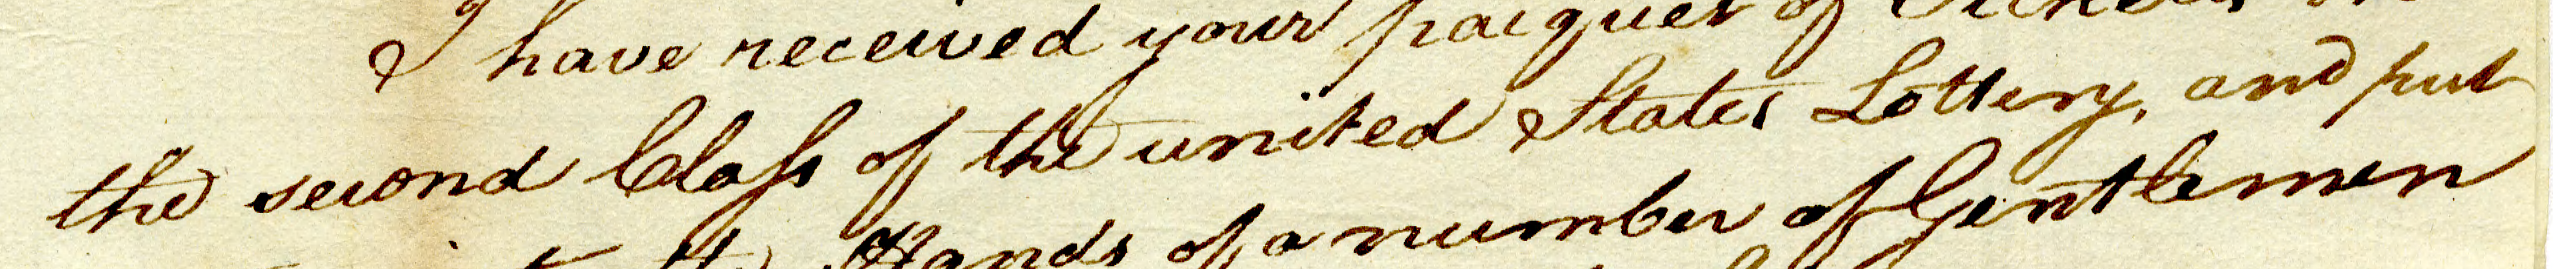the second Class of the United States Lottery, and put
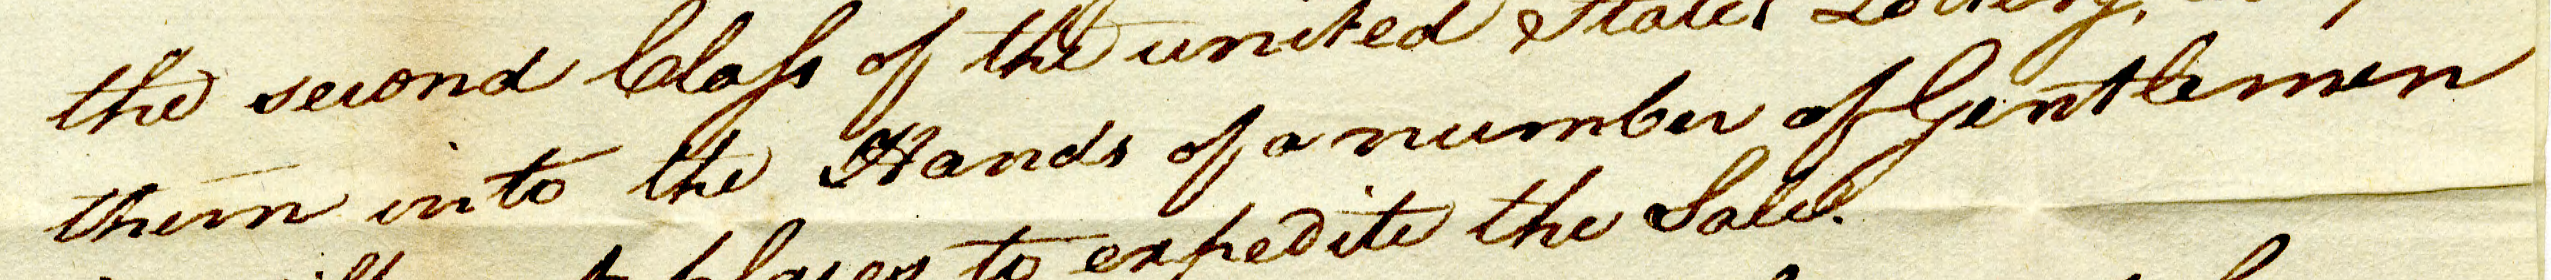them into the hands of a number of Gentlemen
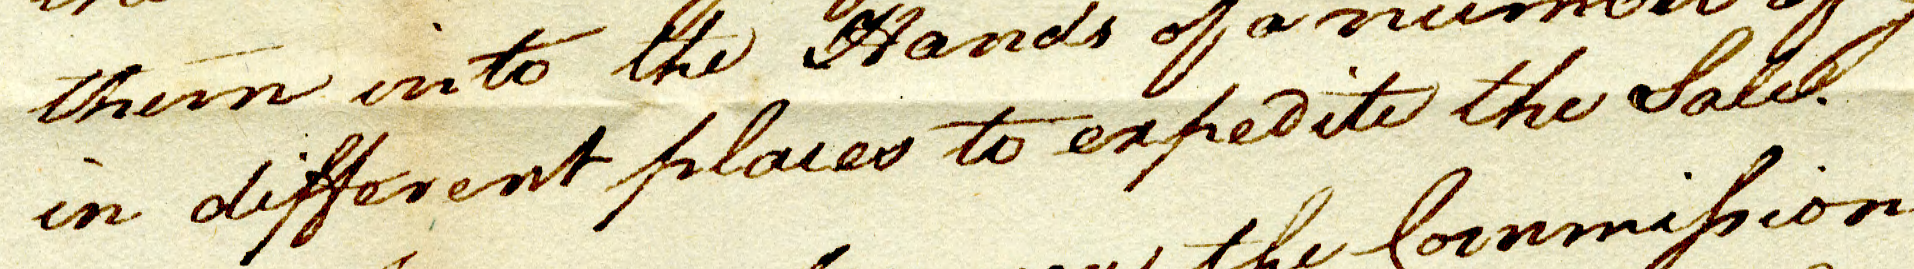in different places to expedite the Sales.
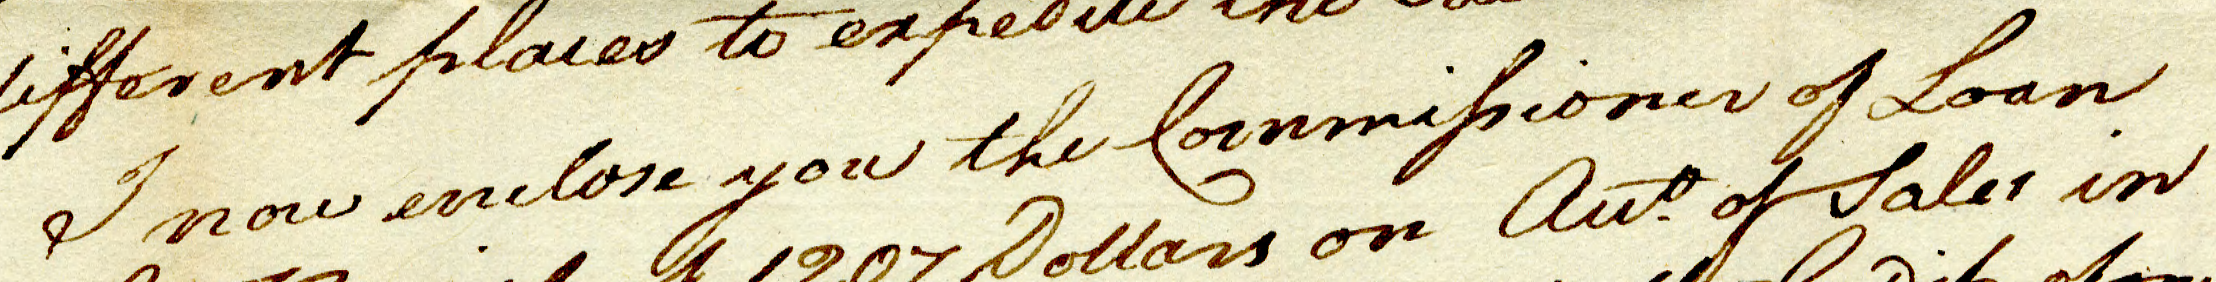I now enclose you the Commissioner of Loan
